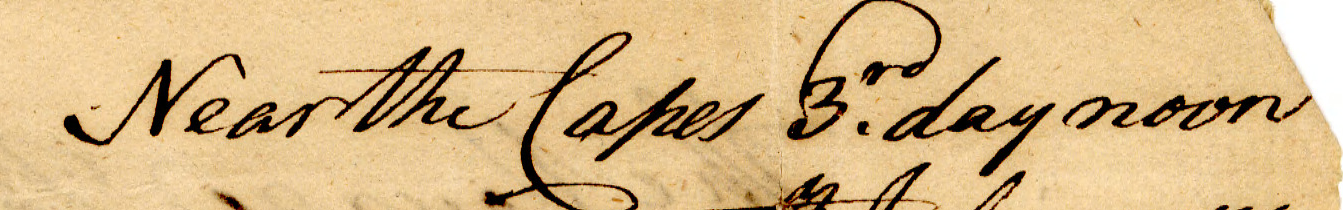Near the Capes 3^rd. day noon
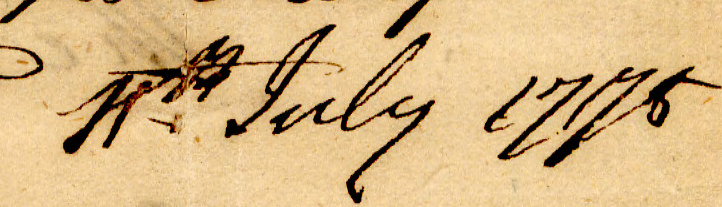11^th July 1775
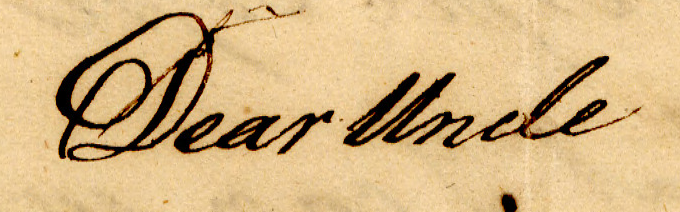Dear Uncle
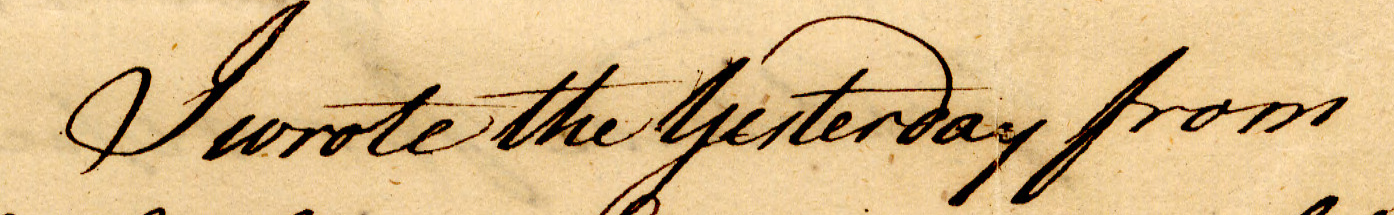I wrote the yesterday from
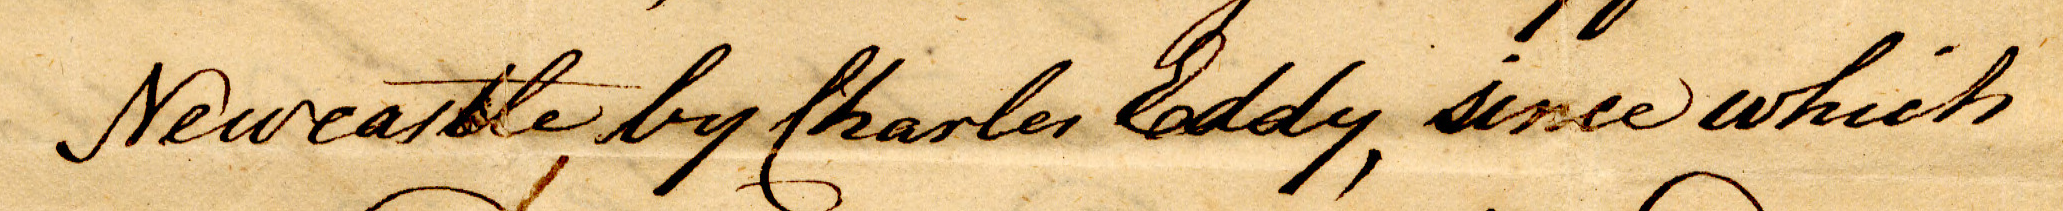Newcastle by Charles Eddy, since which
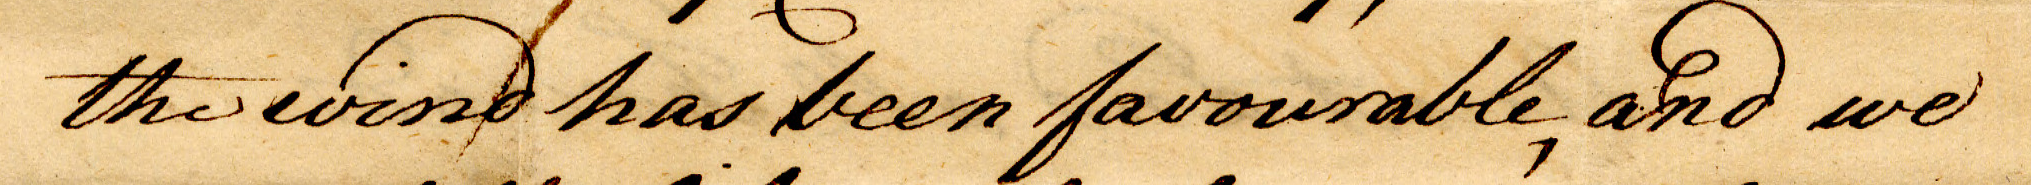the wind has been favourable, and we
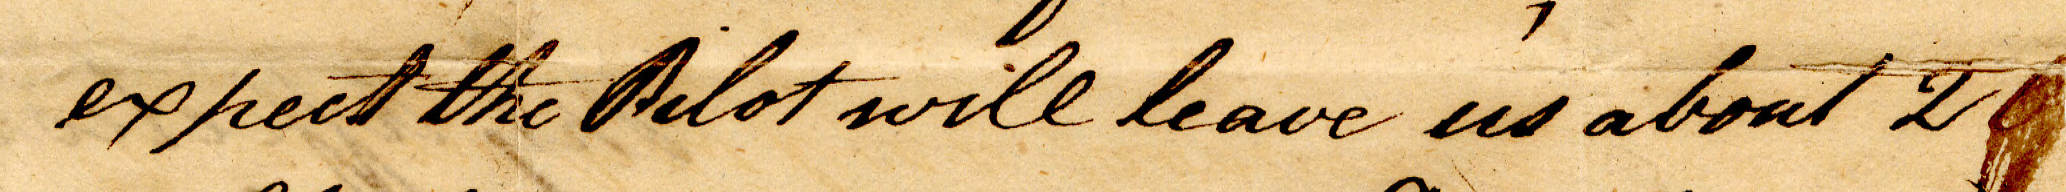expect the Pilot will leave us about 2
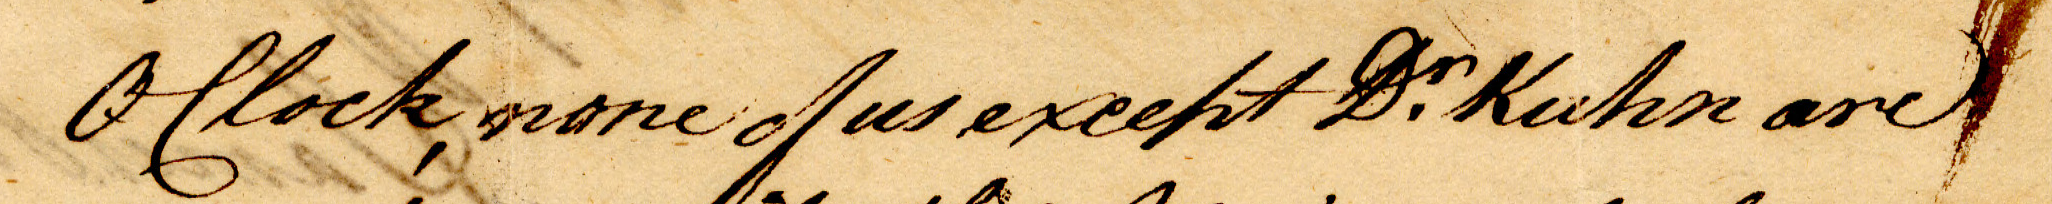oClock, none of us except D^r. Kuhn are
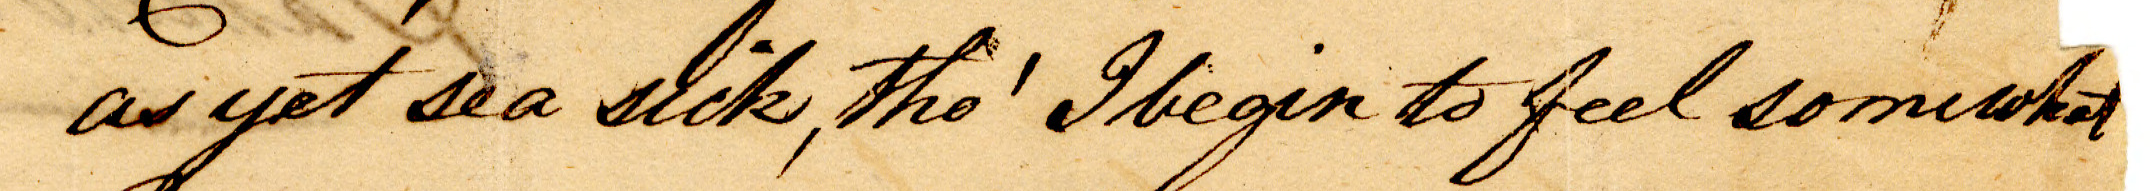as yet sea sick, tho' I begin to feel somewhat
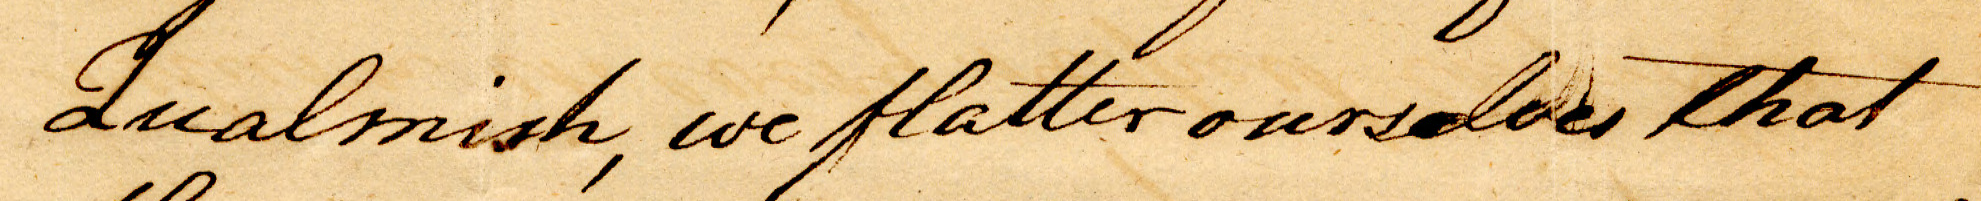Qualmish, we flatter ourselves that
